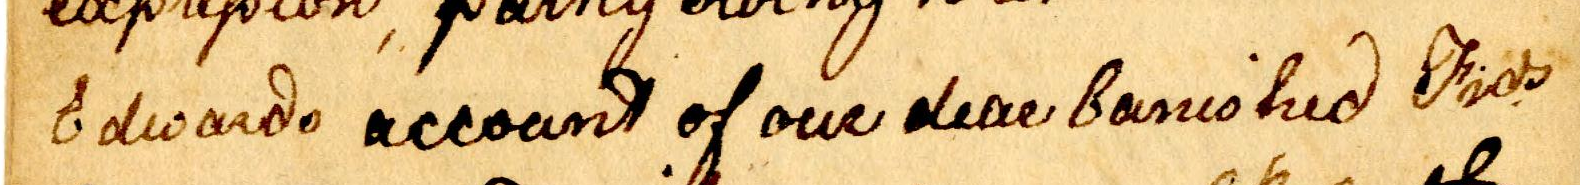Edwards account of our dear banished Frd^s
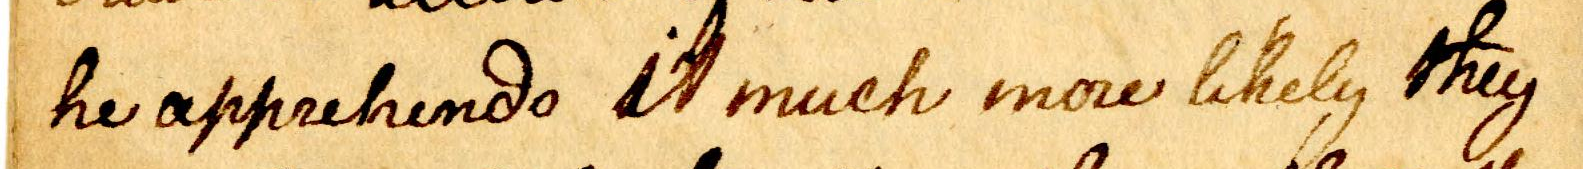he apprehends it much more likely they
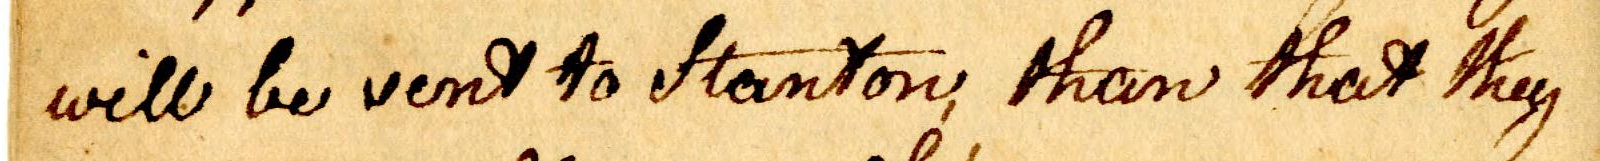will be sent to Stanton, than that they
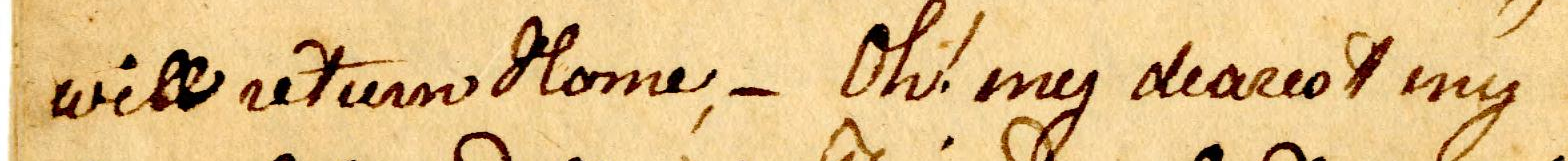will return Home- Oh! my dearest my
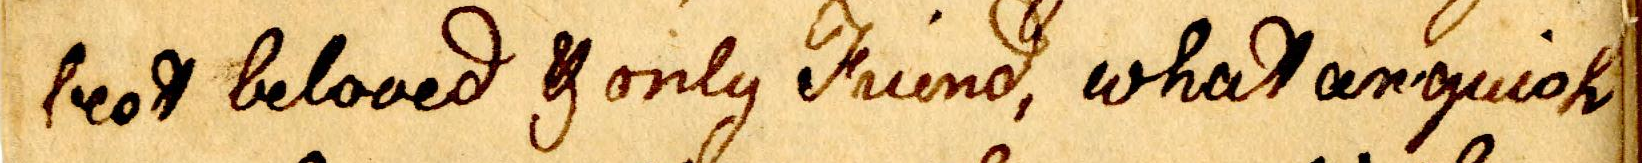best beloved & only Friend, what anguish
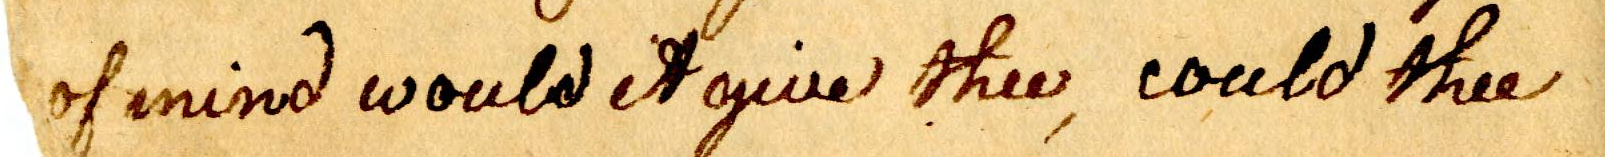of mind would it give thee, could thee
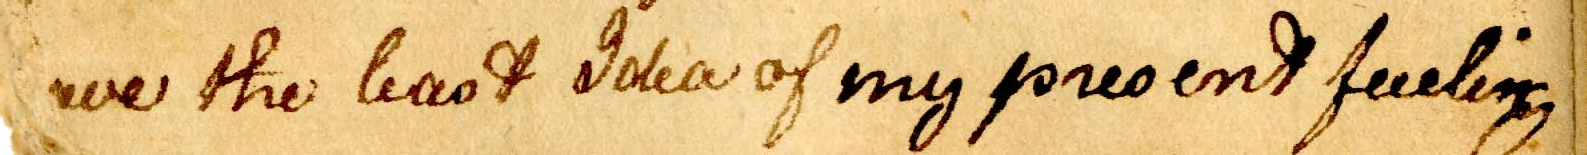eve the last Idea of my present feeling
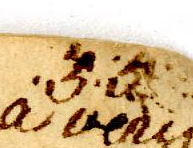55
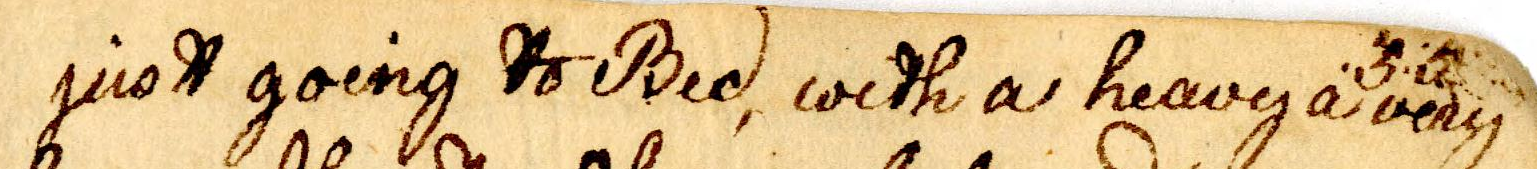just going to Bed with a heavy a very
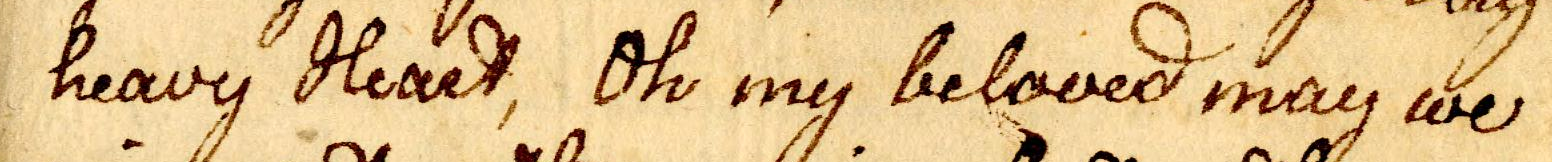heavy Heart, Oh my beloved may we
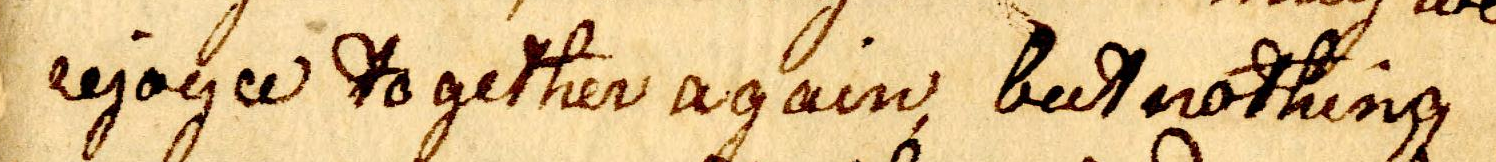rejoyce together again, but nothing
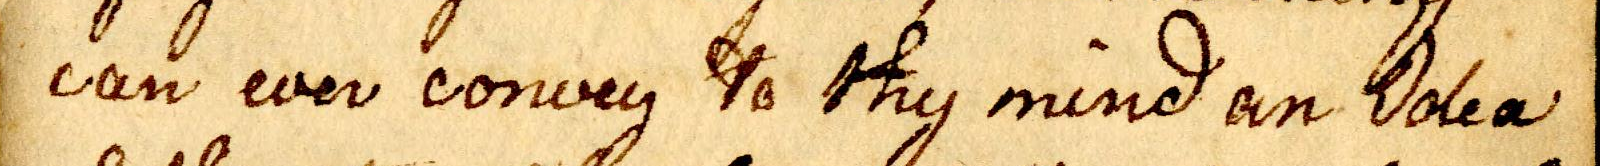can ever convey to thy mind an Idea
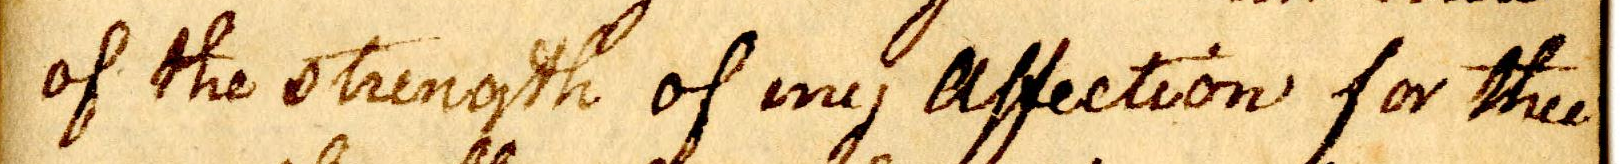of the strength of my Affection for thee
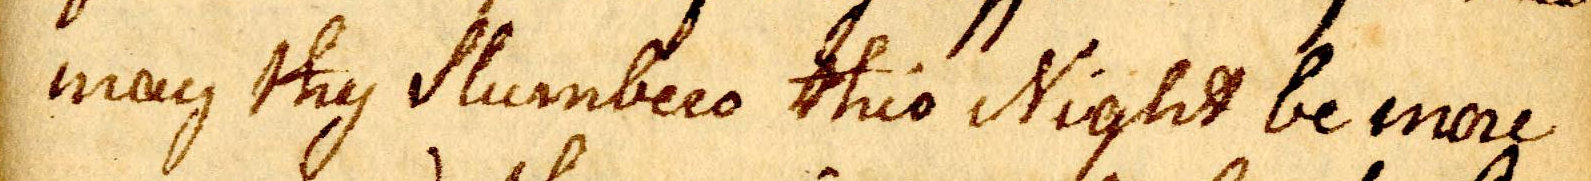may thy Slumbers this Night be more
